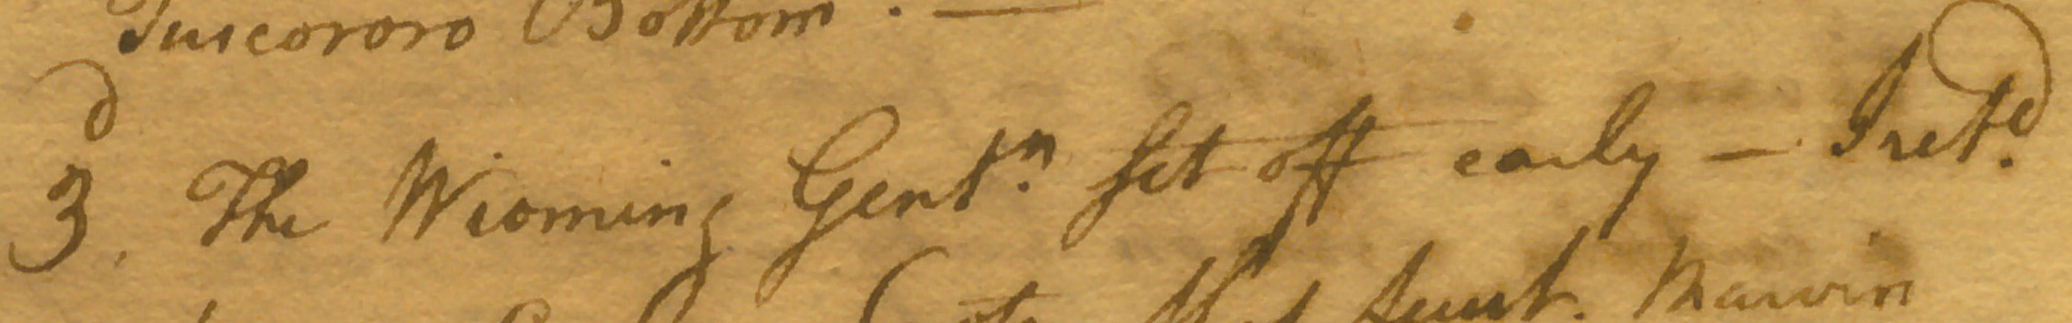3^d. The Wioming Gent^n. set off early- I ret^d.
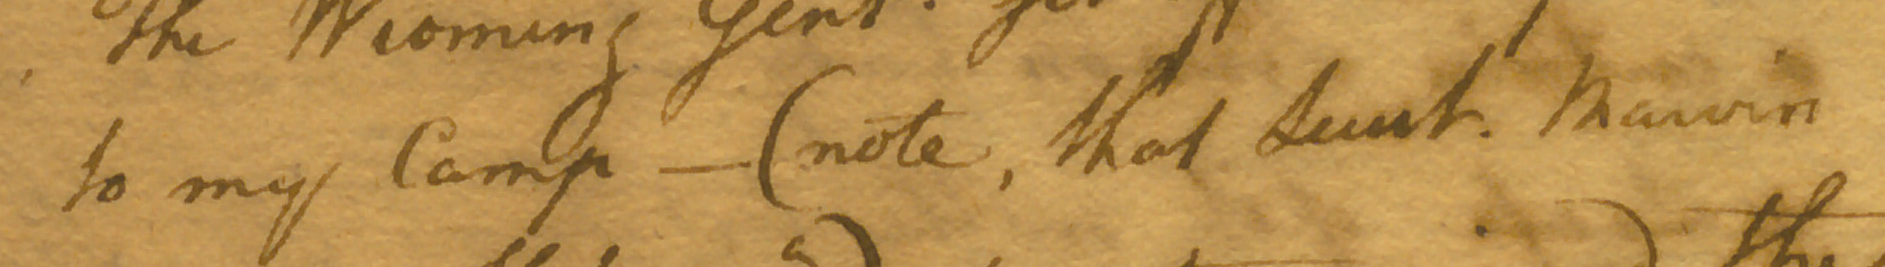to my Camp- (note, that Lieut. Marvin
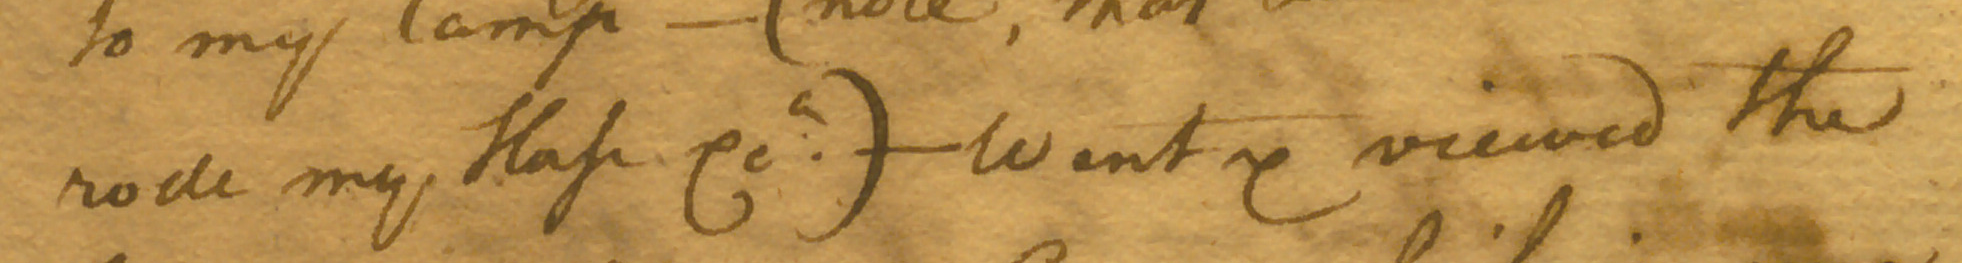rode my Horse &c^a.)- went & viewed the
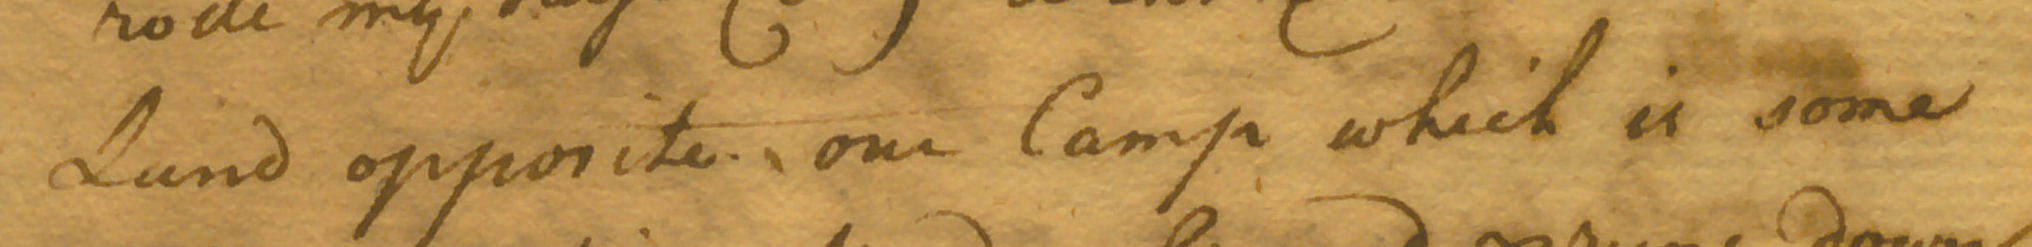Land opposite one Camp which is some
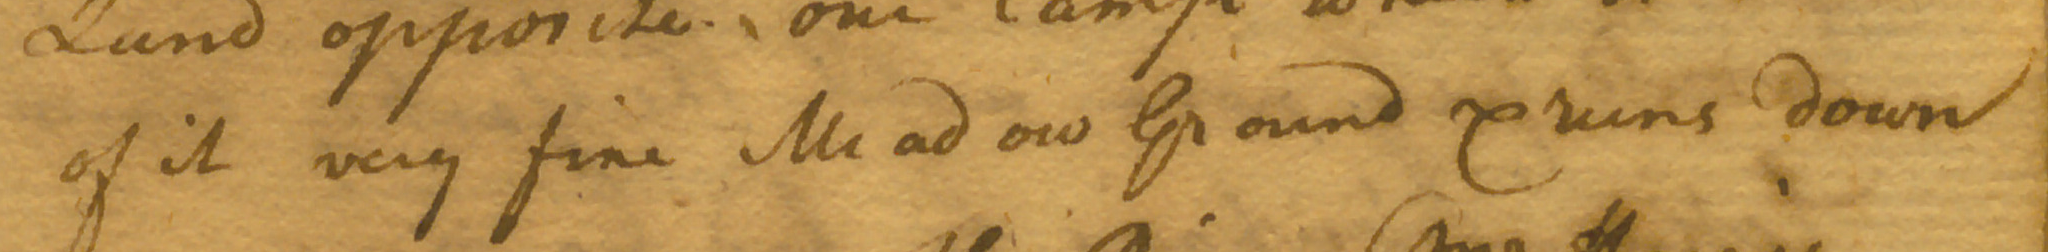of it very fine Meadow Ground & runs down
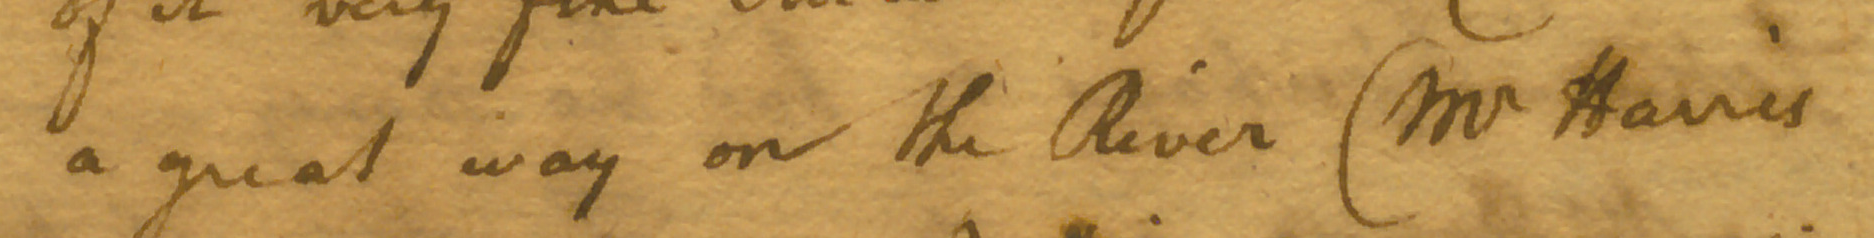a great way on the River (M^r Harris
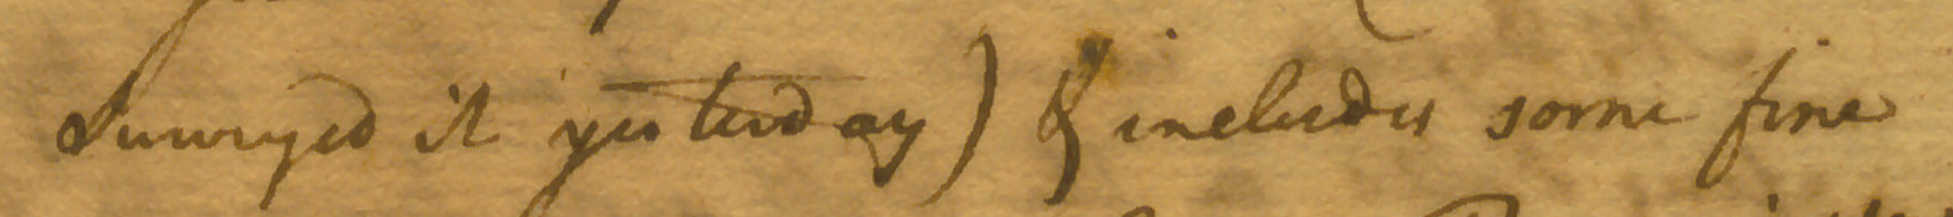surveyed it yesterday) & includes some fine
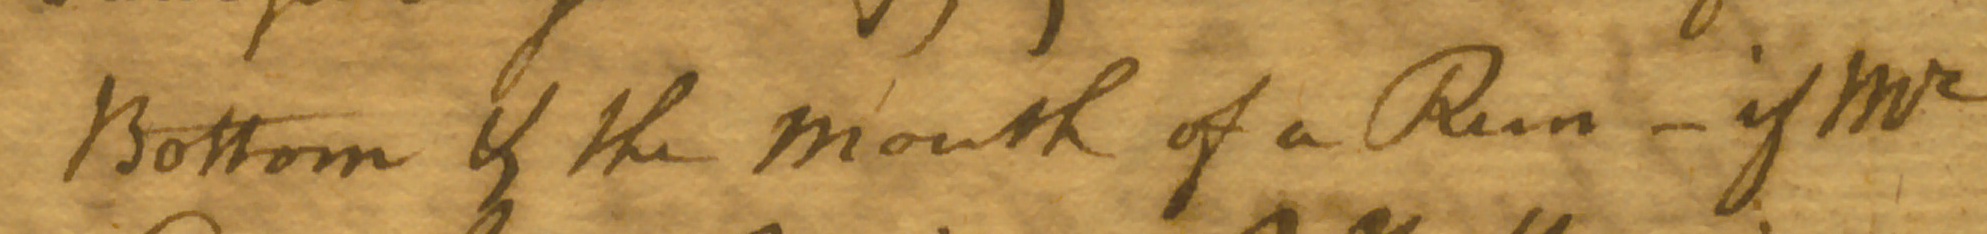Bottom & the mouth of a Run- if M^r
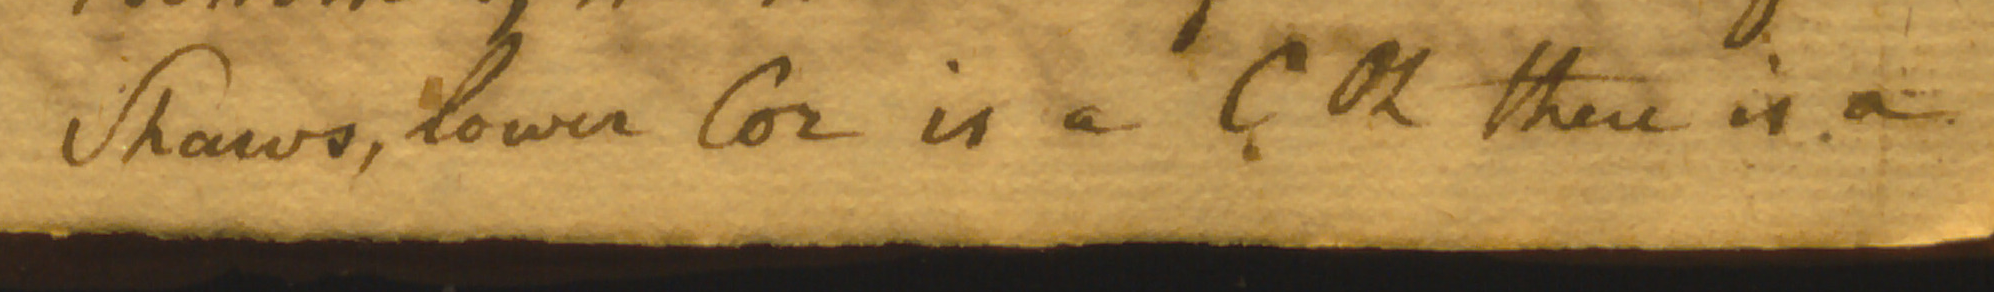Shaws, lower Cor is a C 0h there is a
